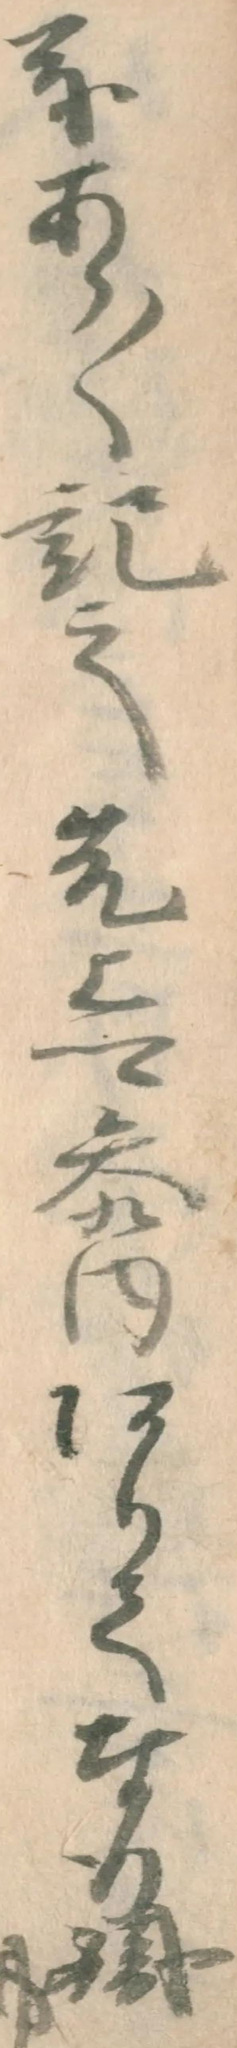義あら〳〵記之先上卿参内ありて奉行職事
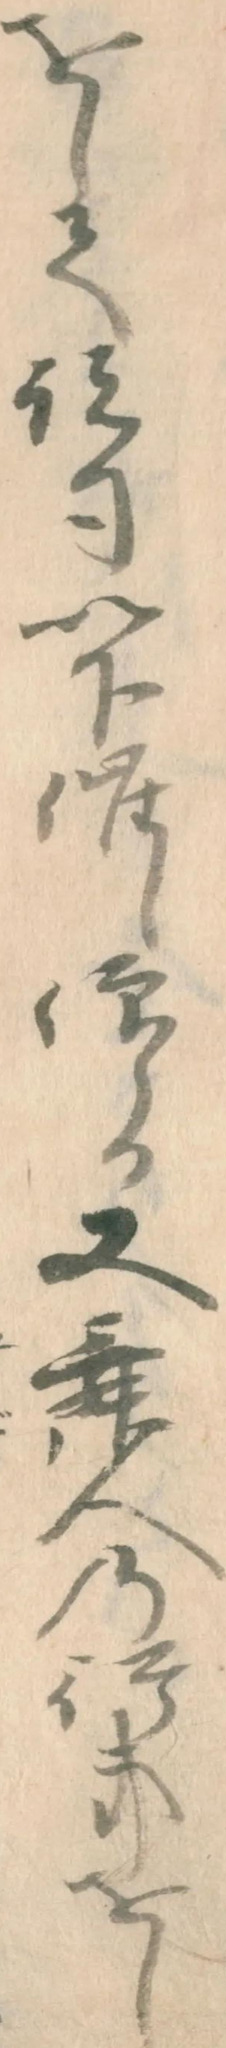をして諸司以下催し仰らる又舞-人の行事をし
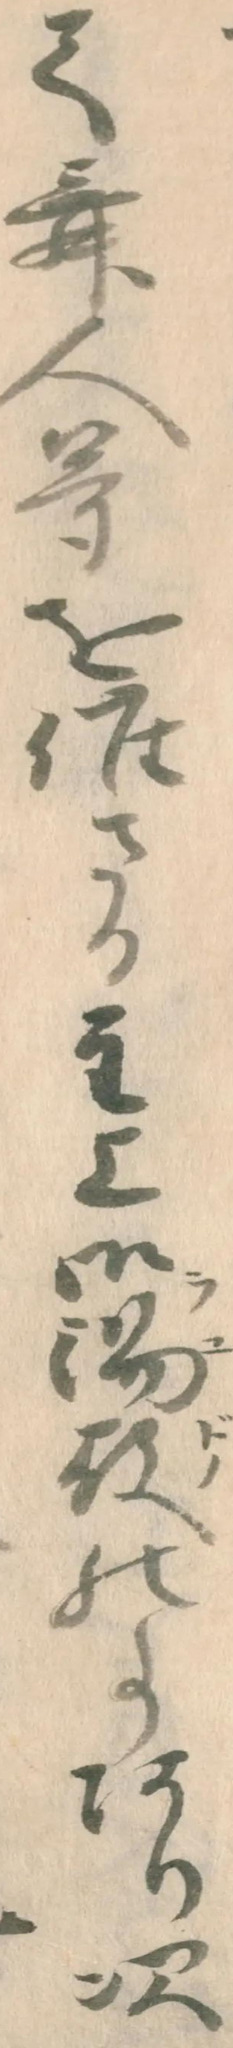て舞人等を催さる主上御湯殿の事あり次
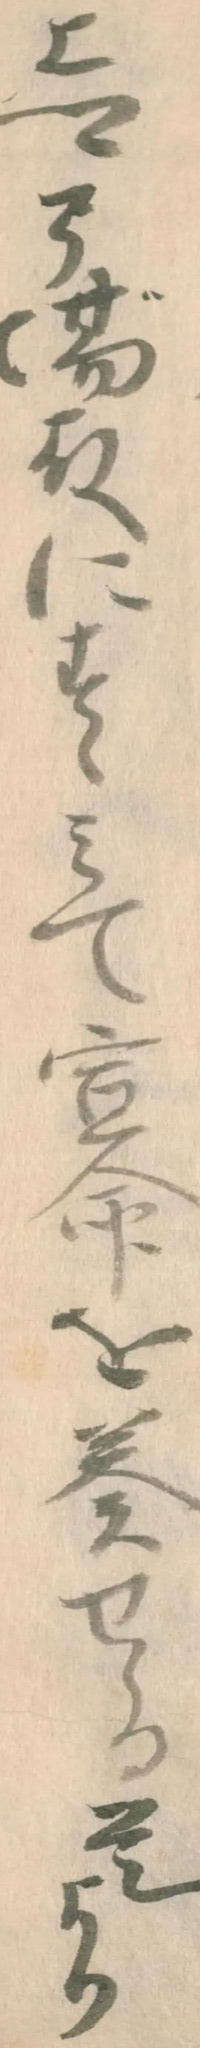上卿弓場殿にすゝみて宣命を奏せらる是より
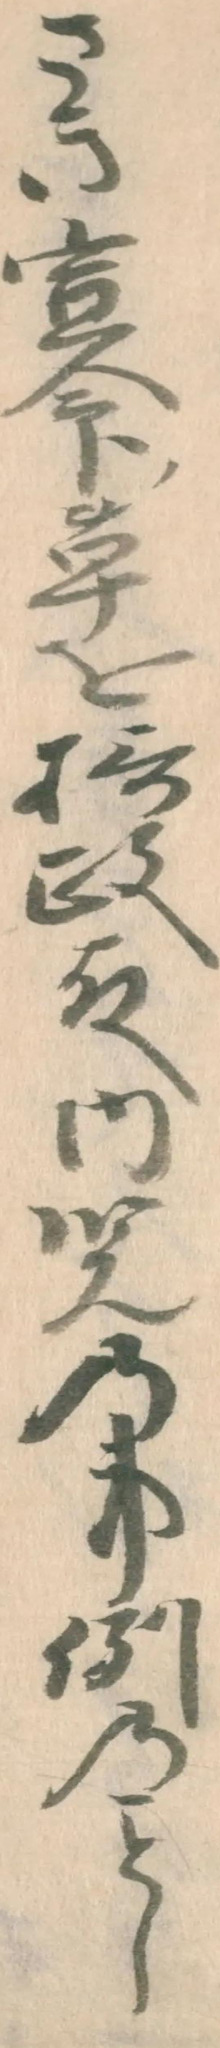さき宣命草を摂政殿内覧の事例のことし
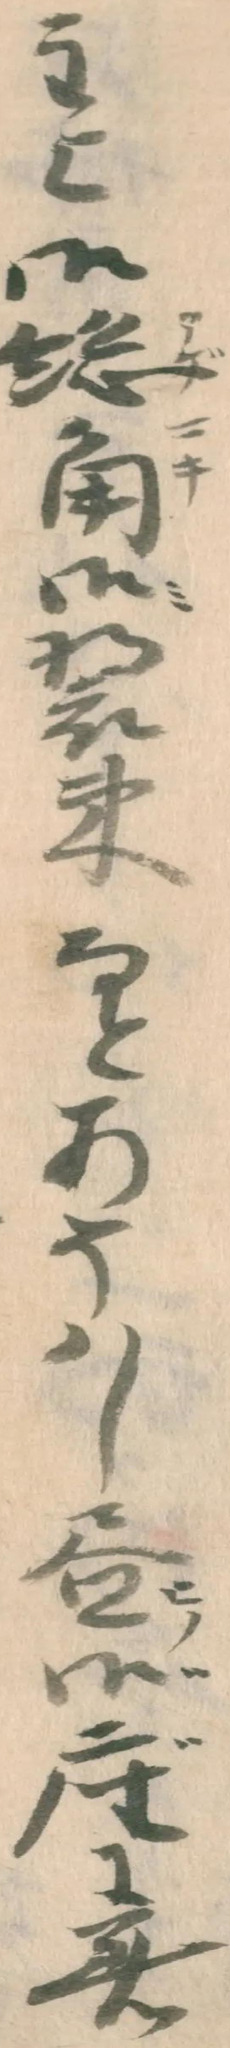主上御総角御装束なとあそはし昼御座に着
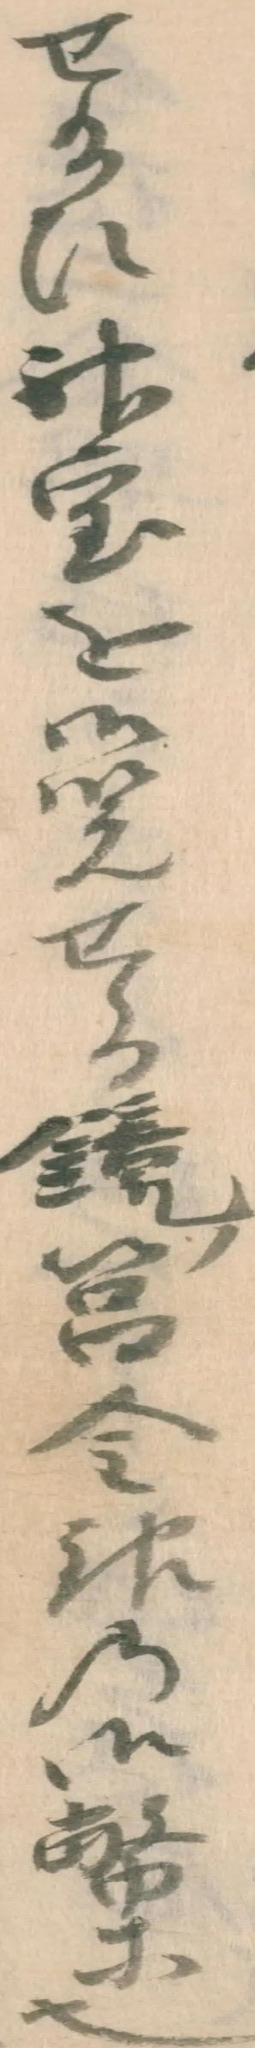せ給ひ神宝を御覧せらる鏡筥金銀の御幣等也
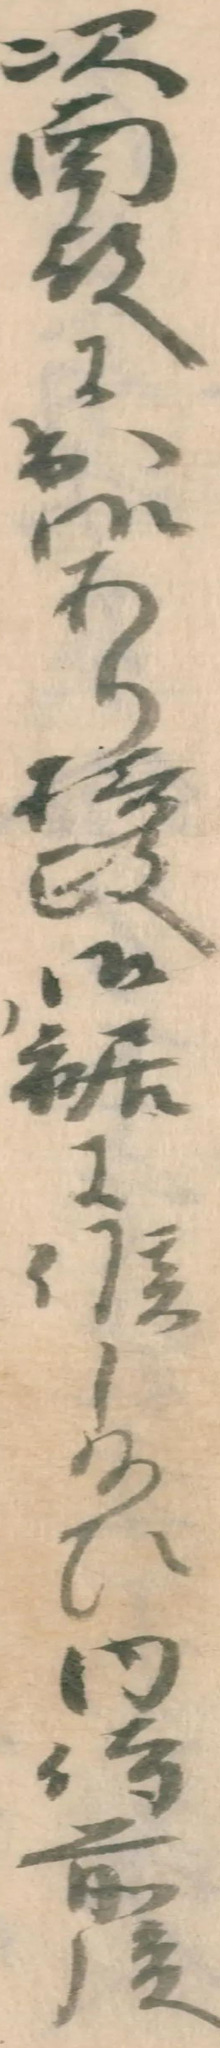次南殿に出御あり摂政御-裾に候し給ひ内侍前後
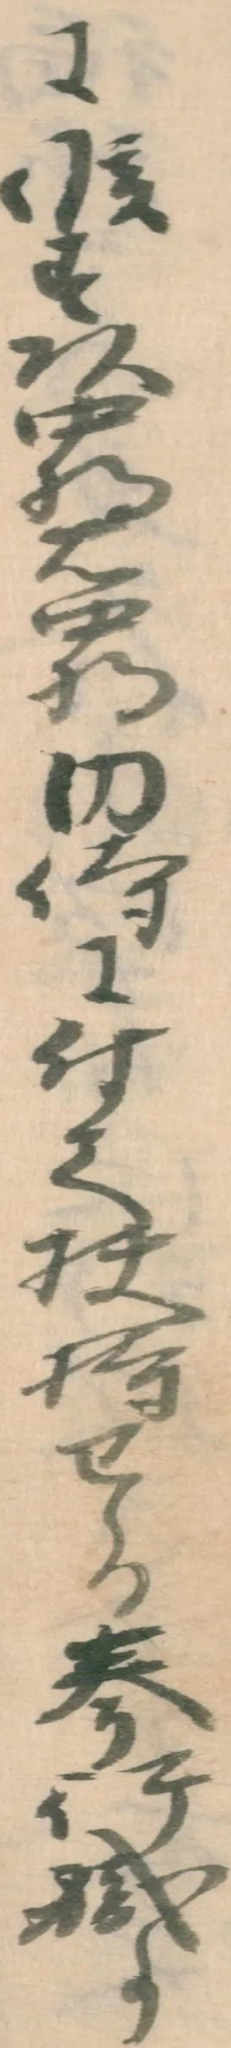に候す頭中将右中将内侍に付て扶持せらる奉行職事
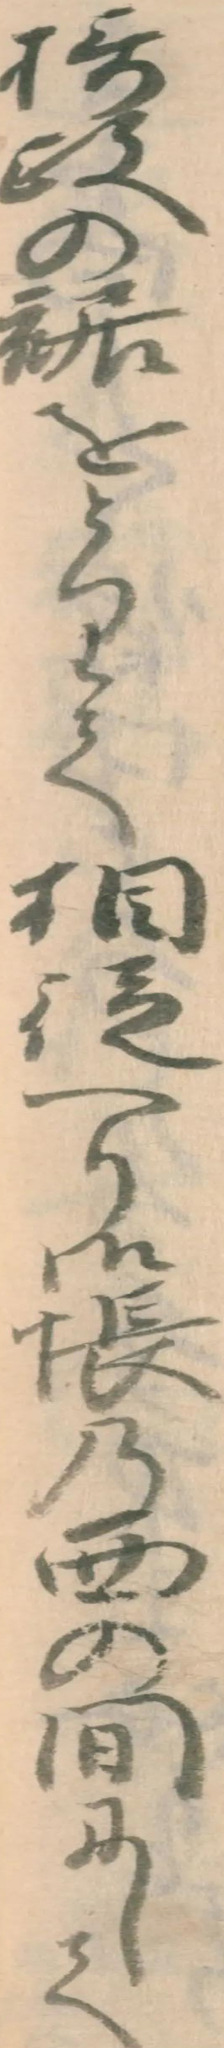摂政の裾をとりて相従へり御帳の西の間にして
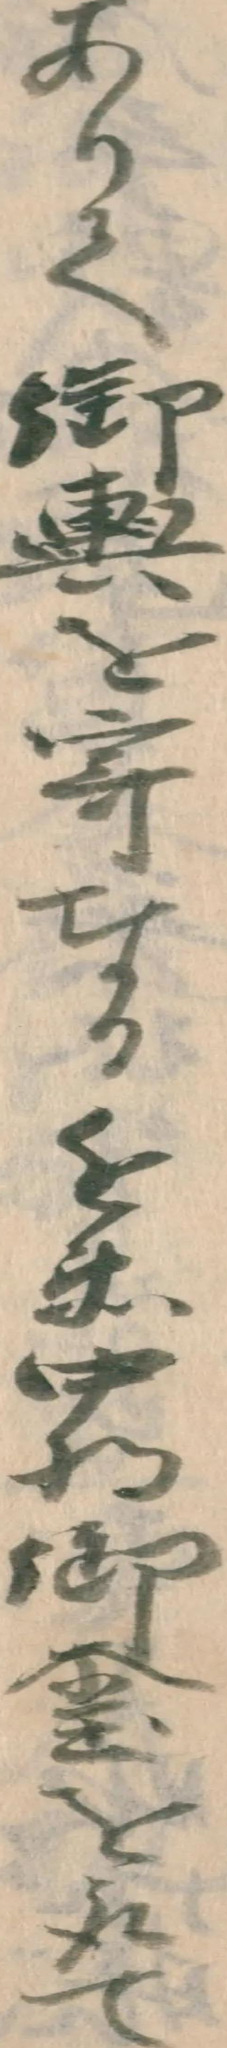ありて御輿を寄奉る近衛中将御壐を取て
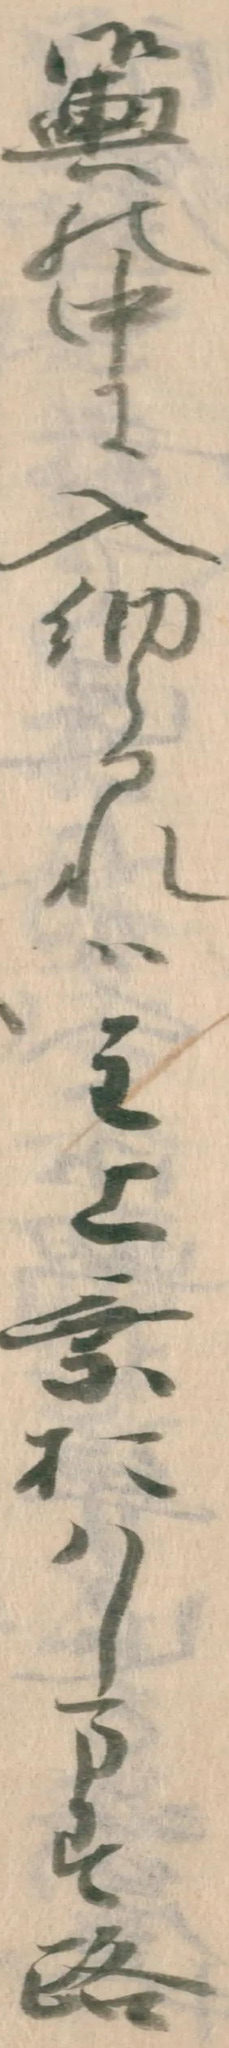御輿の中に入納らるれは主上乗おはします路
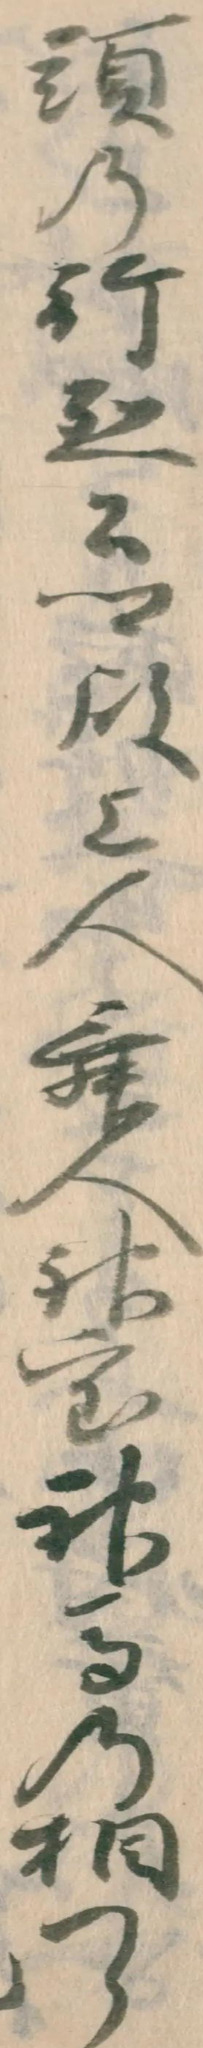頭の行烈公卿殿上人舞人神宝神馬の相つら
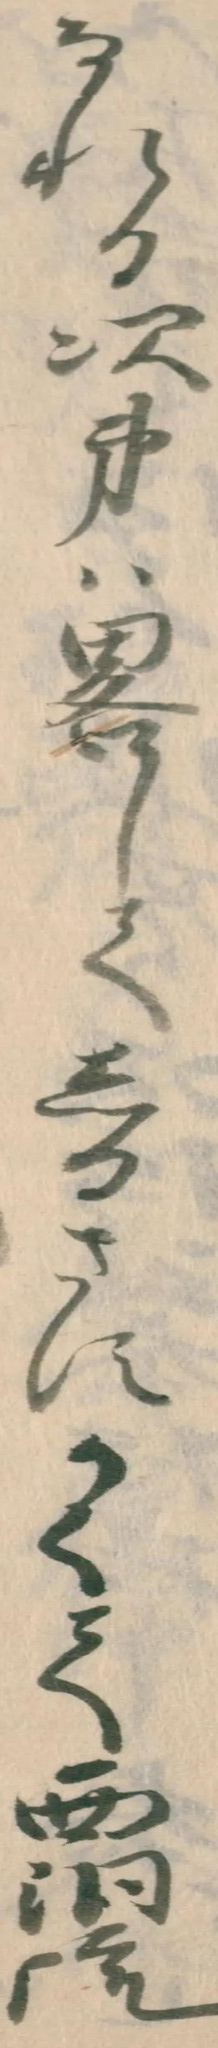なれる次第は略してしるさすかくて西洞院
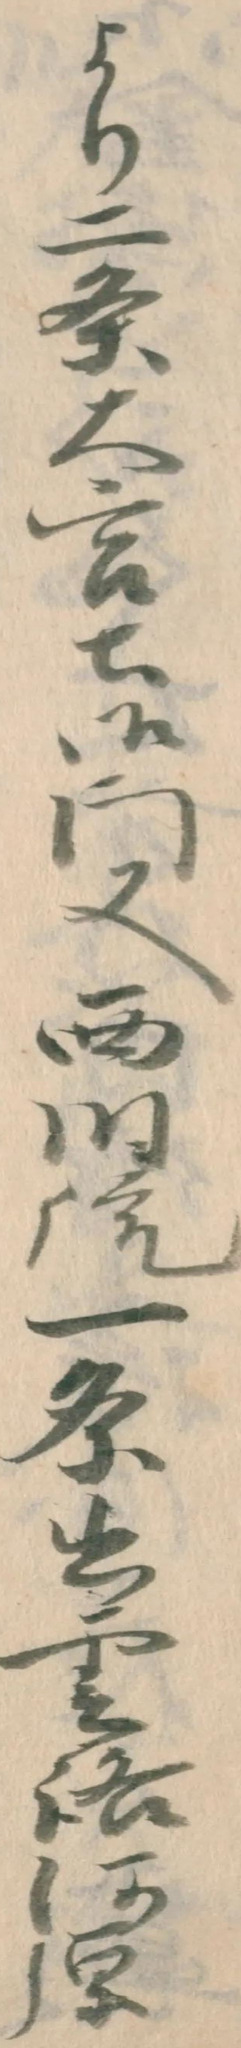より二条大宮土御門又西洞院一条出雲路河原
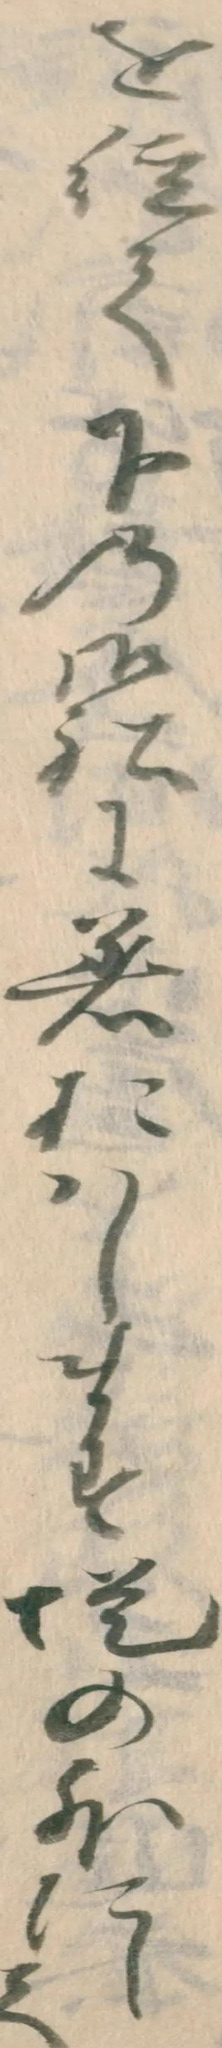を経て下の御社に着おはします堤の外にして
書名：賀茂社記録. 第1冊
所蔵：国立国会図書館 National Diet Library, JAPAN
